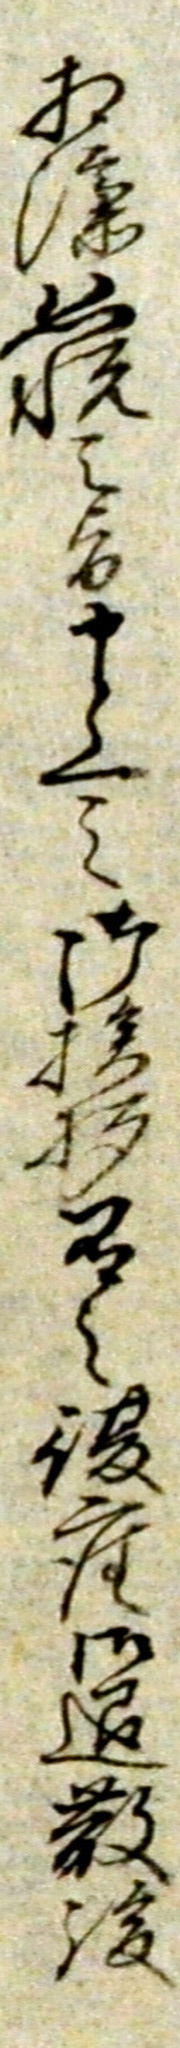相添恐悦之旨申上之御挨拶有之役座御退散後
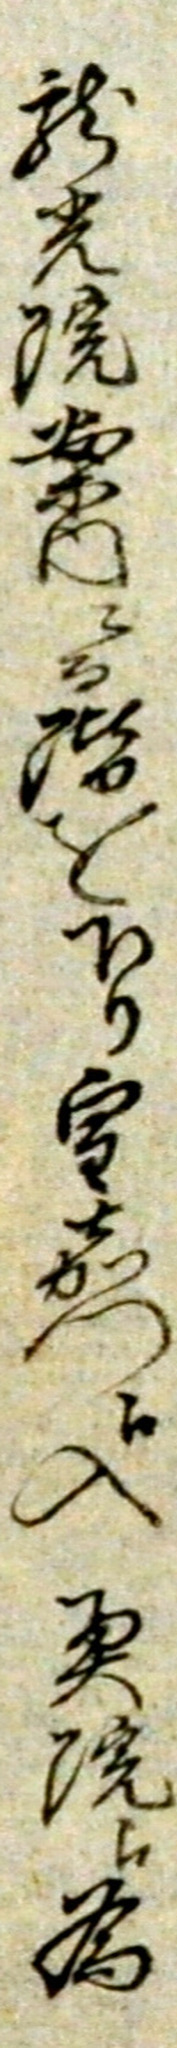龍光院案内二而階を下り皇嘉門江入奥院江為

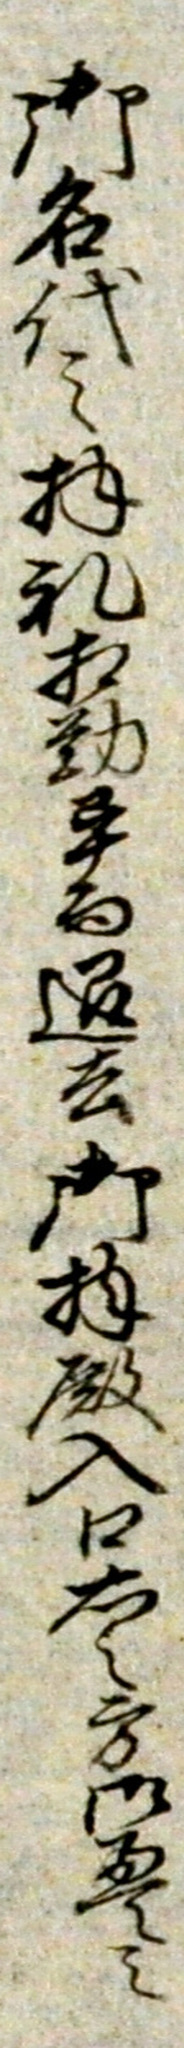御名代之拝礼相勤畢而退去御拝殿入口右之方御畳之
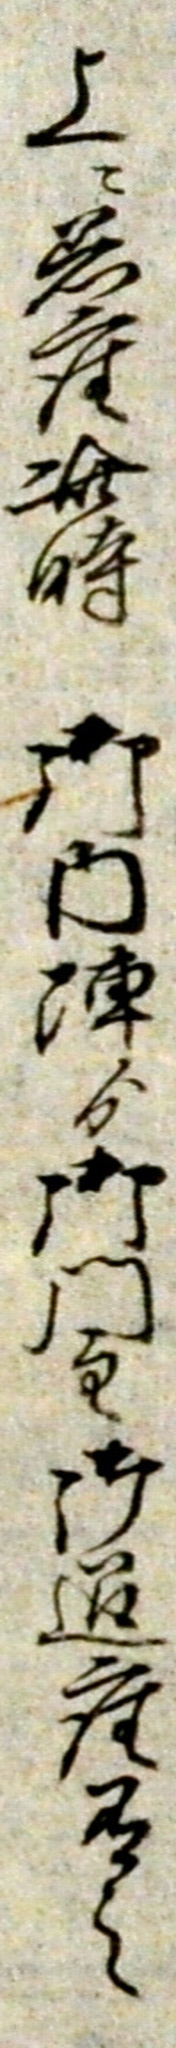上ニ着座此時御内陣ゟ御門主御退座有之
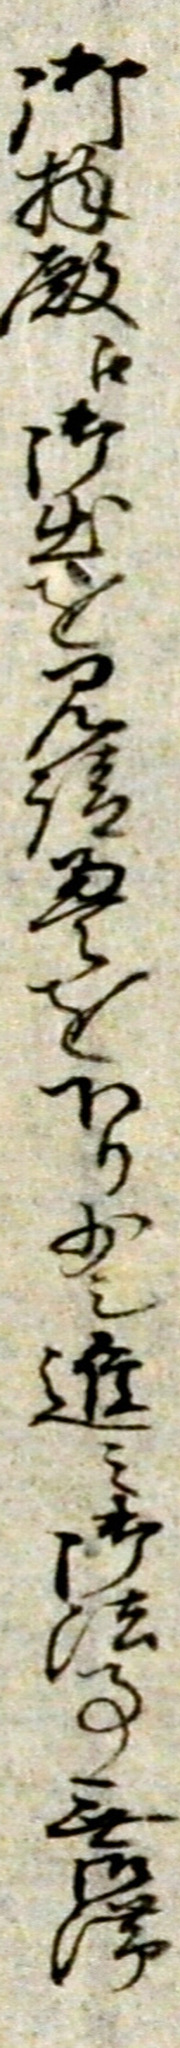御拝殿江御出を見請畳を下り少し進ミ御法事無御滞
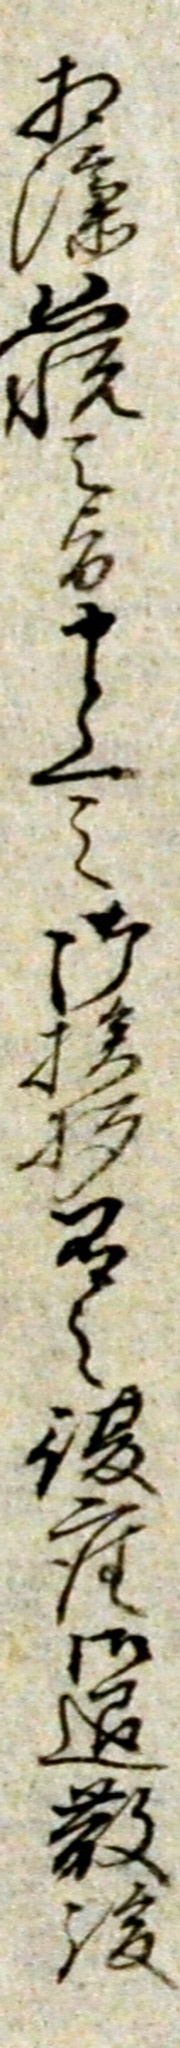相済恐悦之旨申上之御挨拶有之複座御退散後
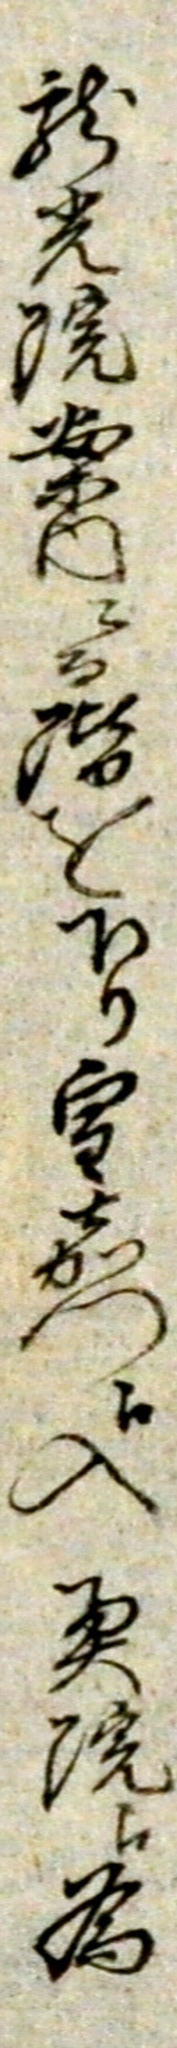龍光院案内ニ而階を下り皇嘉門江入奥院江為
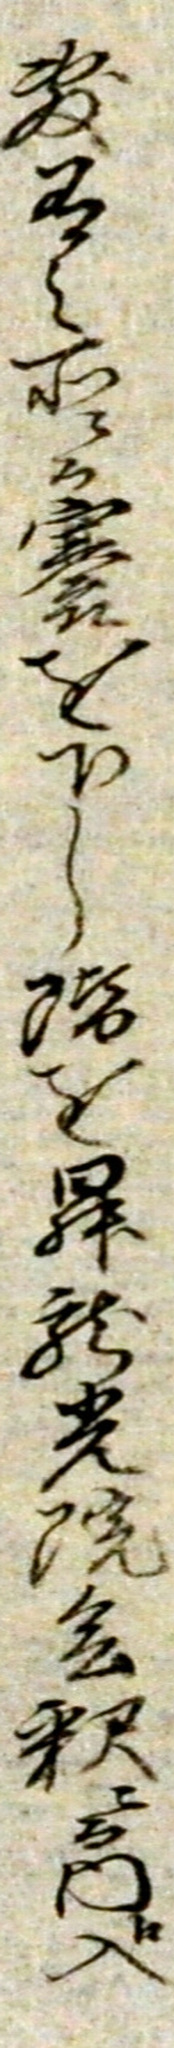敷有之所々ニ而寒衣を下し階を昇龍光院会釈ニ而内江入
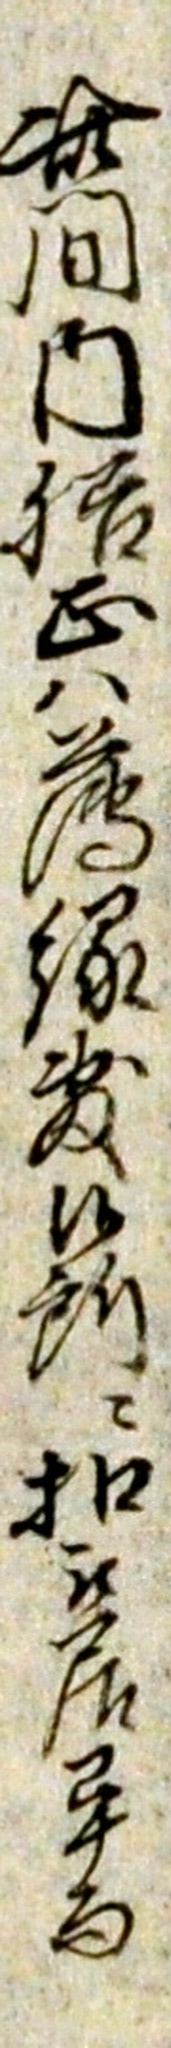此間内膳正ハ薄縁敷候所ニ扣被居畢而
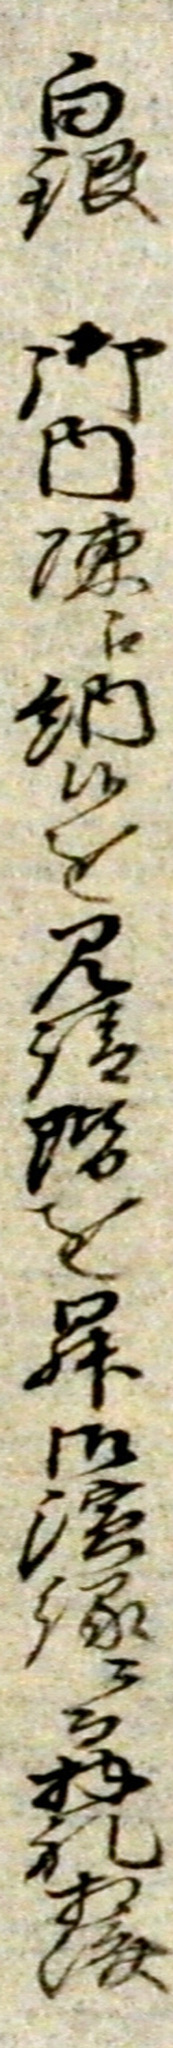白銀御内陳江納候を見請階を昇御演縁ニ而拝礼相済
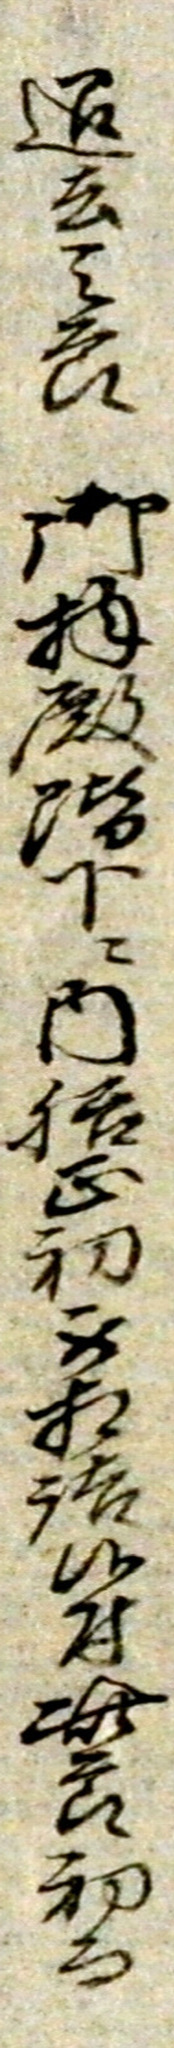退去之節御拝殿階下ニ内膳正初被相詰候付此節初而
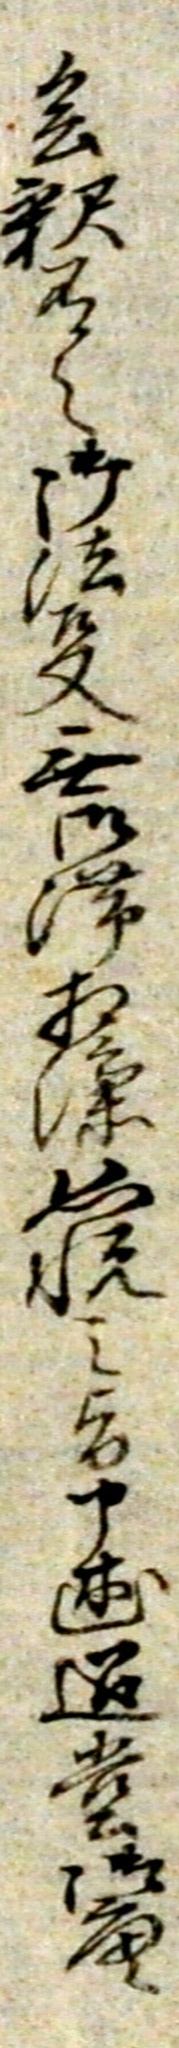会釈有之御法事無御滞相済恐悦之旨申述退堂御唐
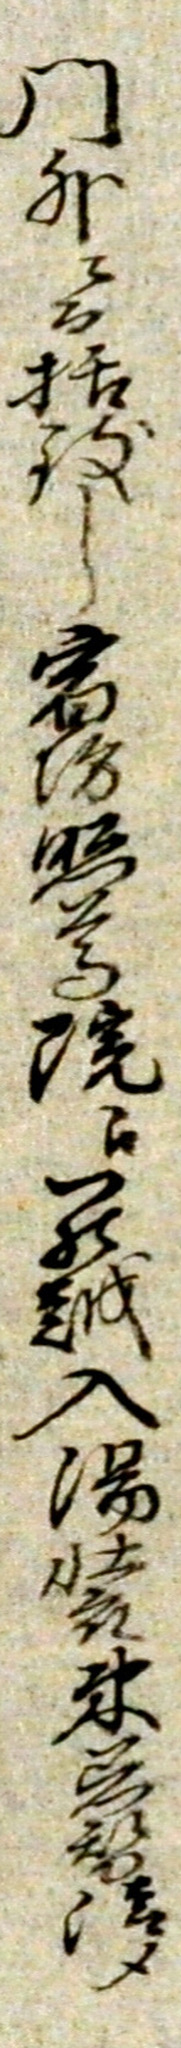門外ニ而据致し宿坊照尊院江罷越入湯装束着替清メ
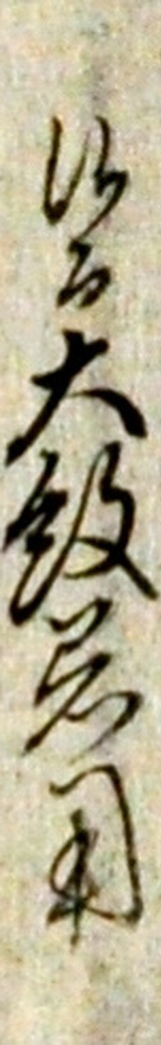候而大紋着用
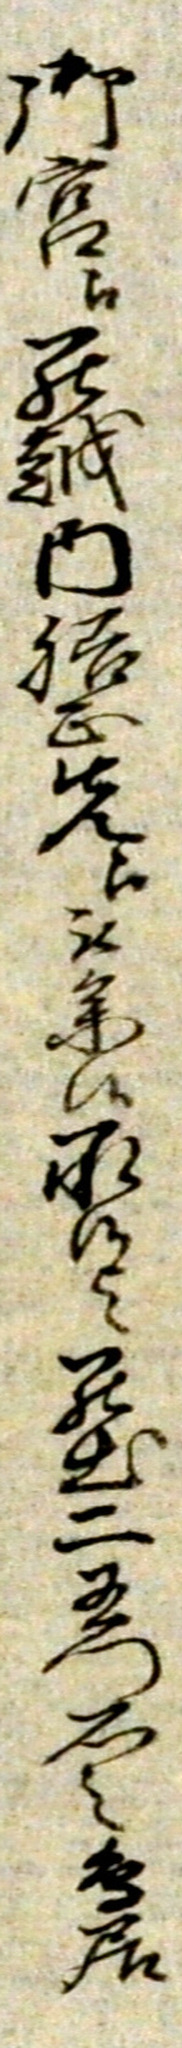御宮江罷越内膳正先江被参候承候と罷出二王門石之鳥居
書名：日光御名代相勤候節ノ留
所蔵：伊那市立高遠町図書館・合同会社AMANE
